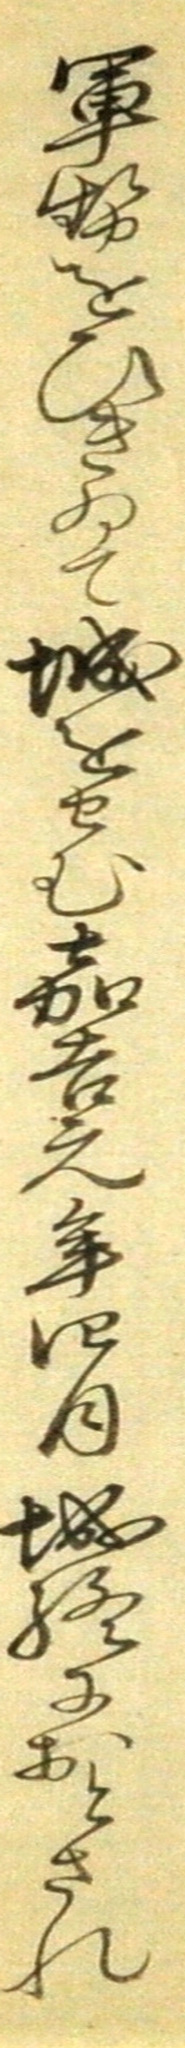軍勢をひきゐて城をせむ嘉吉元年四月城終におとされ
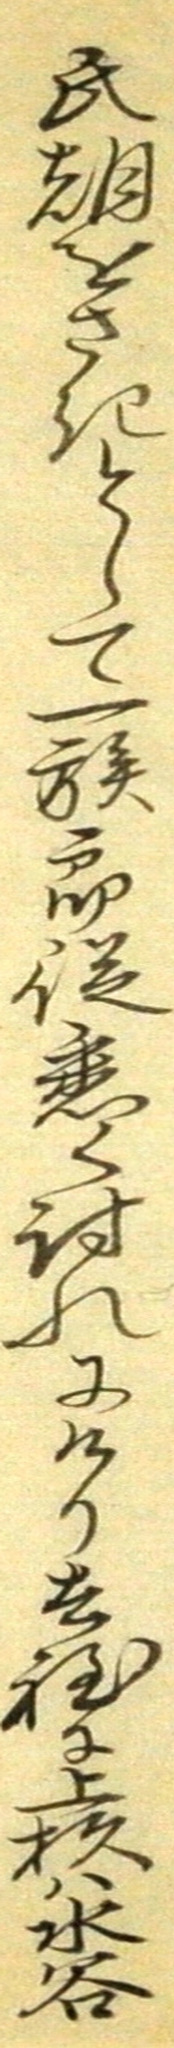氏朝をさきとして一族郎従悉く討れにけり去程に上杉は水谷
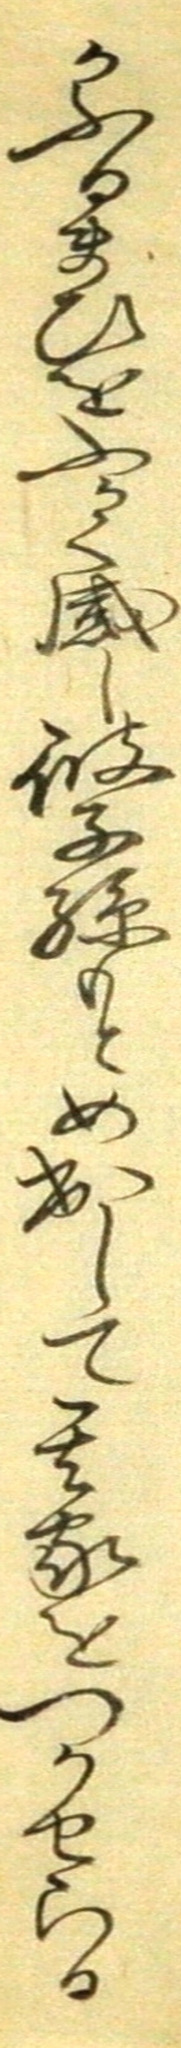かふるまひをふかく感し彼子孫もとめ出して其家をつかせらる
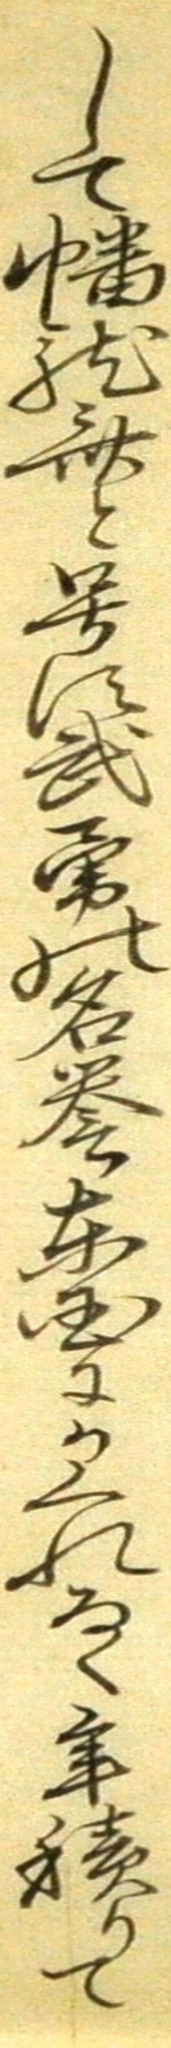して幡竜斎と号す武勇の名誉東国にかくれなく年積りて
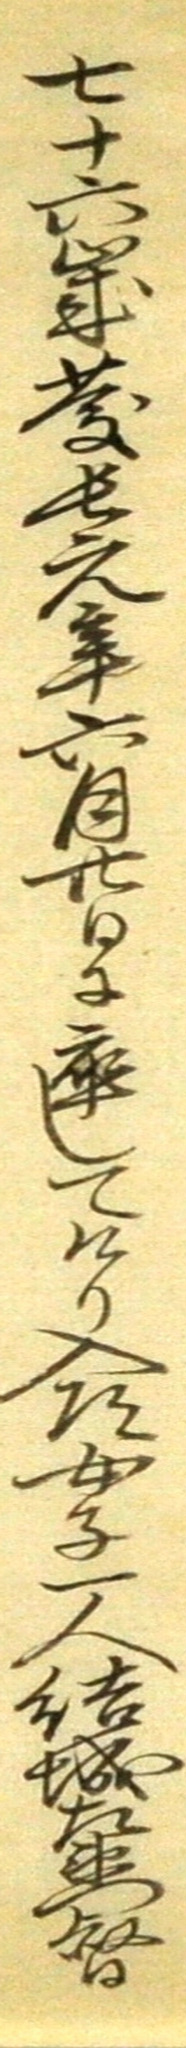七十六歳慶長元年六月廿日に卒してけり入道女子一人結城左衛門督
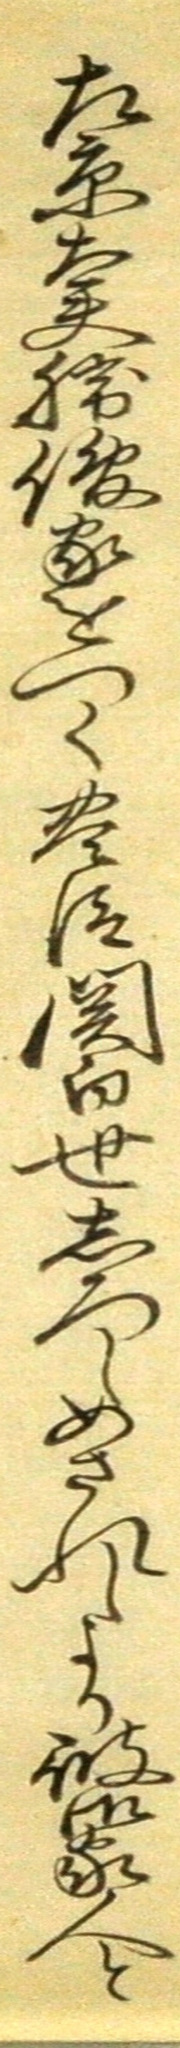左京大夫勝俊家をつく豊臣関白世しろしめされしより彼御家人と
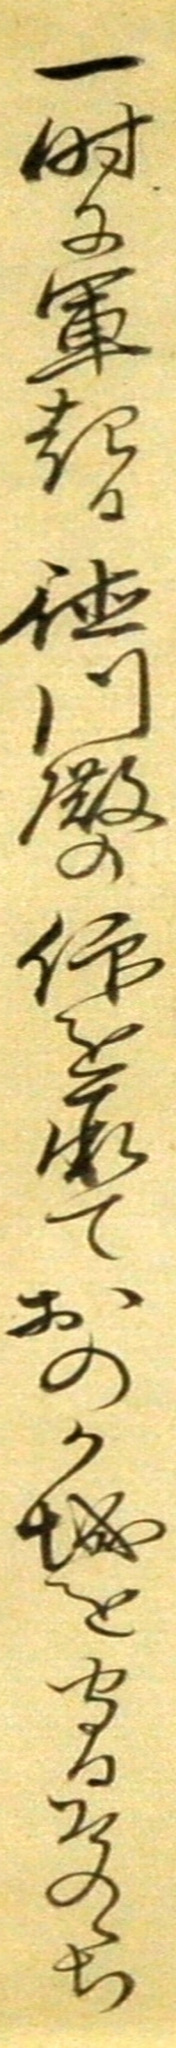一時に軍起る徳川殿の仰を承ておのか城を守るそのゝち
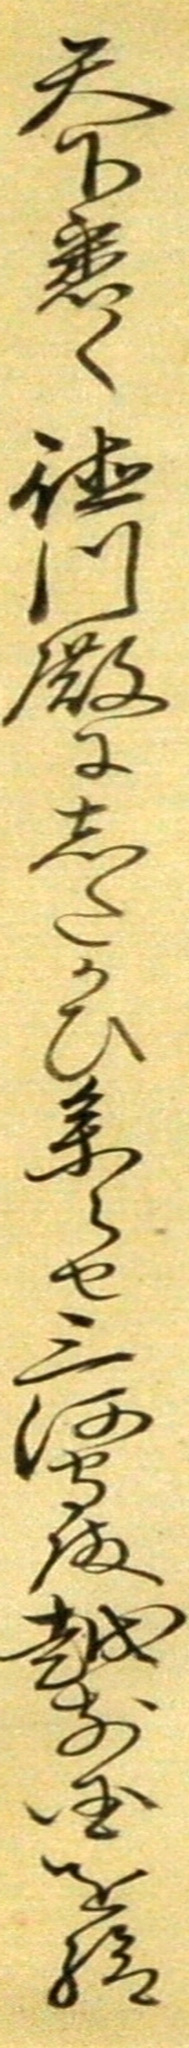天下悉く徳川殿にしたかひ参らせ三河守殿越前国を給
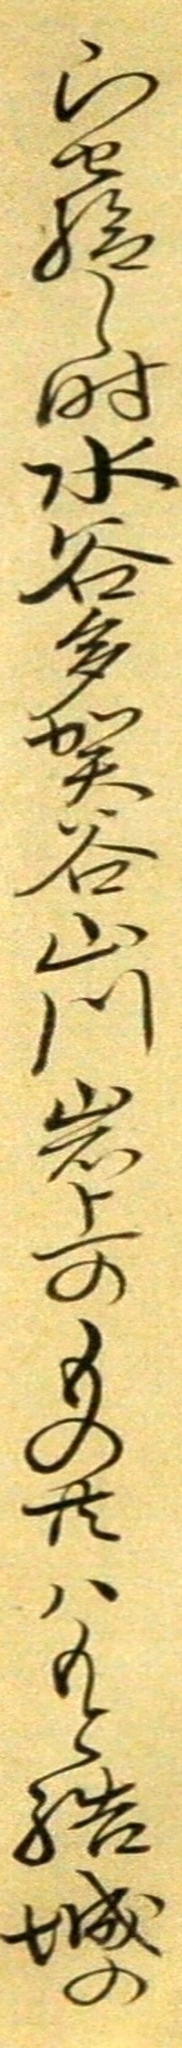らせ給し時水谷多賀谷山川岩上のもの共はもと結城の

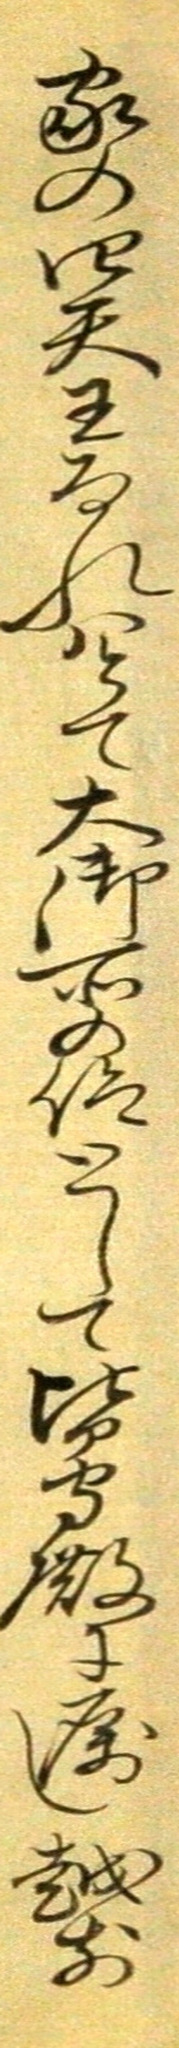家の四天王なれはとて大御所の仰として皆守殿に属し越前
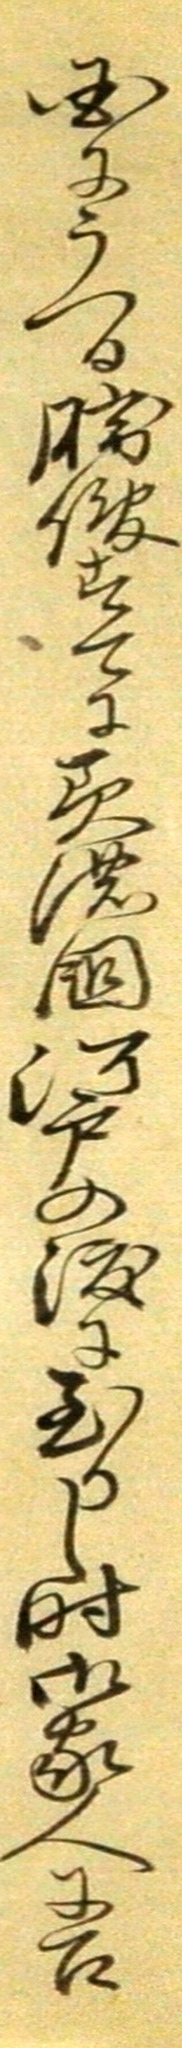国にうつる勝俊すてに美濃国河戸の渡に至りし時御家人に召
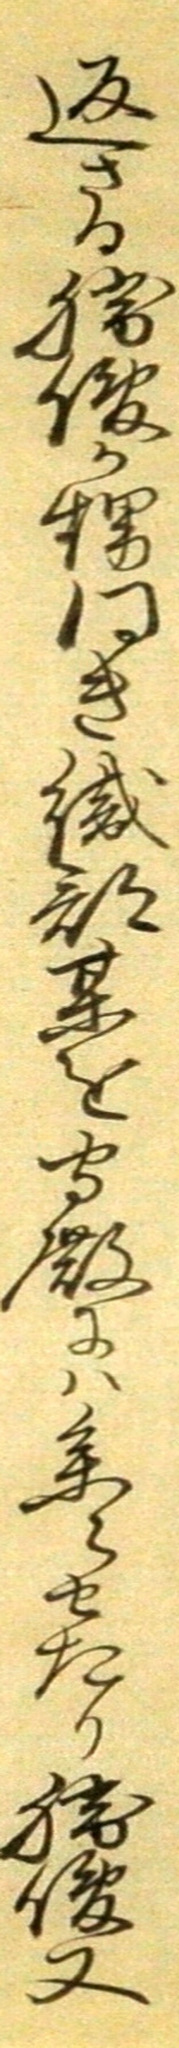返さる勝俊か甥同き織部某を守殿には参らせたり勝俊又
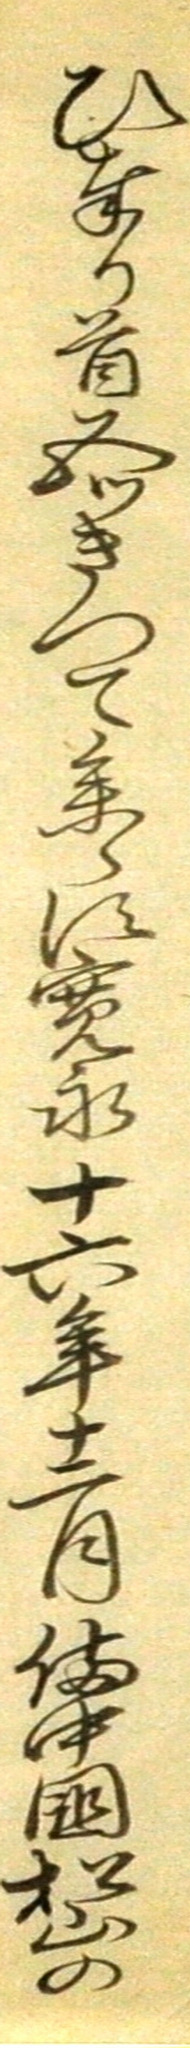ひ奉り首五ッきつて参らす寛永十六年十二月備中国松山の
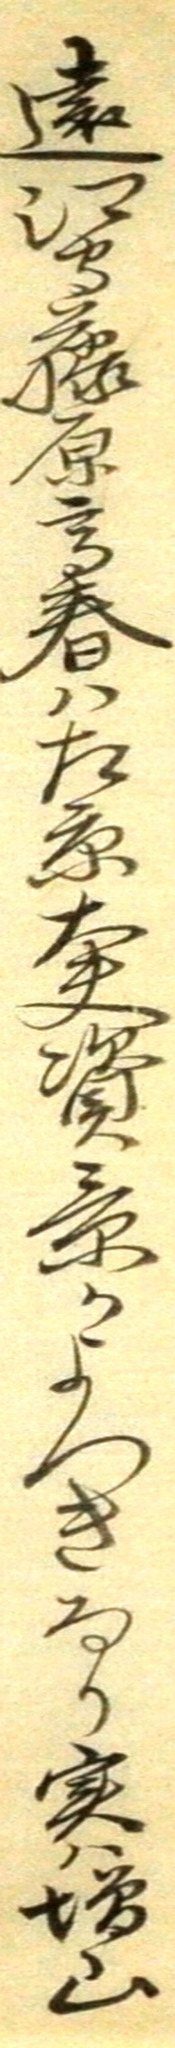遠江守藤原高春は左京大夫資景かよつきなり実は増山
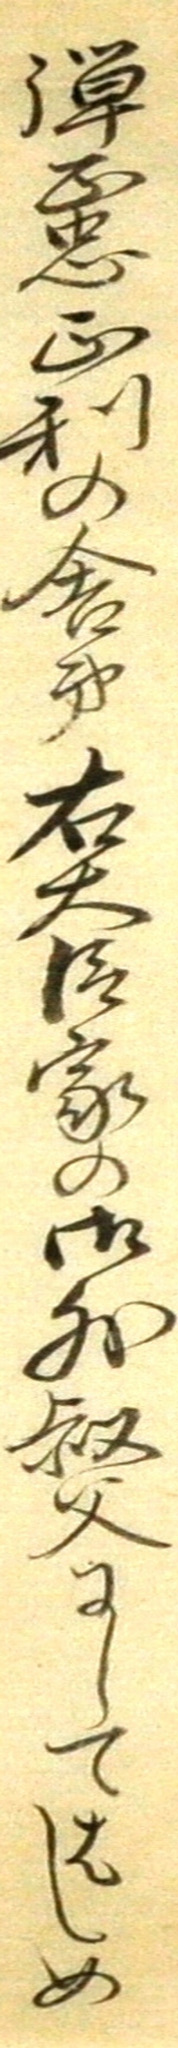弾正忠正利の舎弟右大臣家の御外叔父にしてはしめ
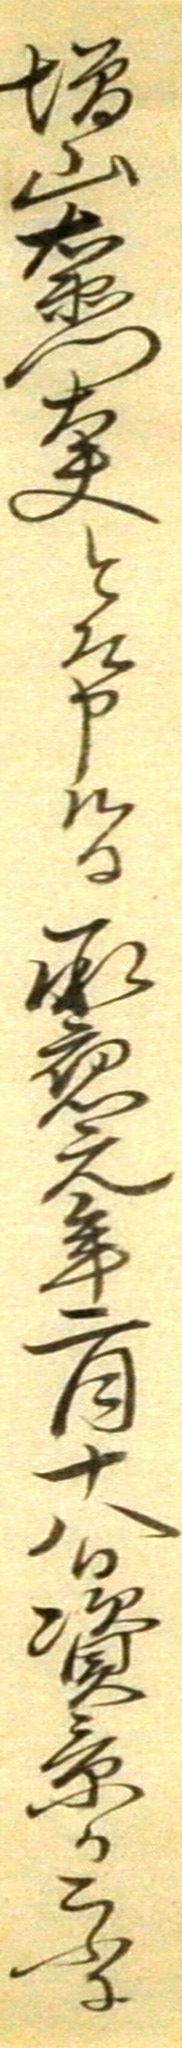増山右衛門大夫とそ申ける承応元年二月十八日資景かこふに
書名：藩翰譜（九・下）
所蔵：伊那市立高遠町図書館・合同会社AMANE
